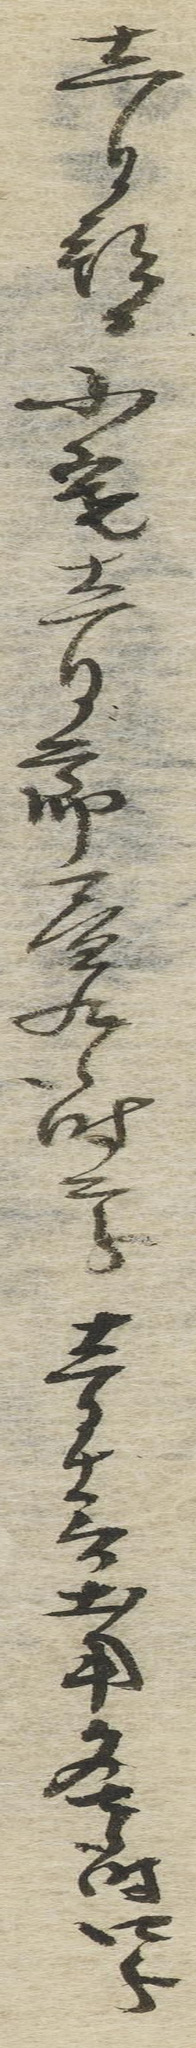十二月朔日小寒十一月節昼九ッ時二分十二月十三日土用夕七ッ時四分
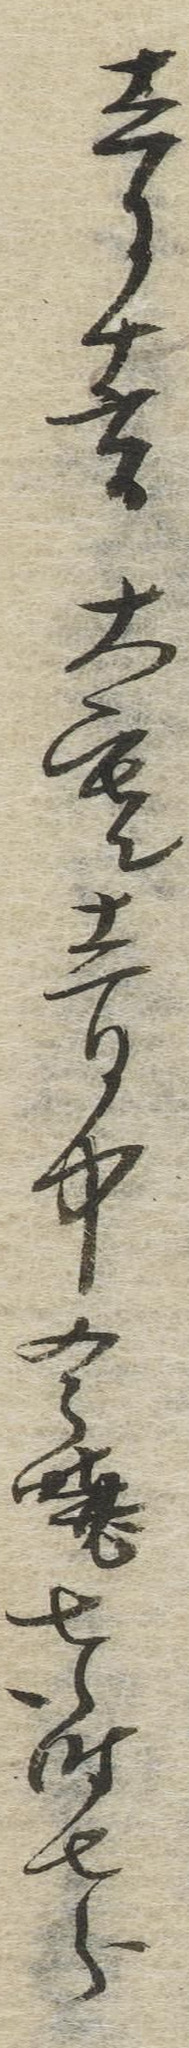十二月十六日大寒十二月中今暁七ッ時七歩

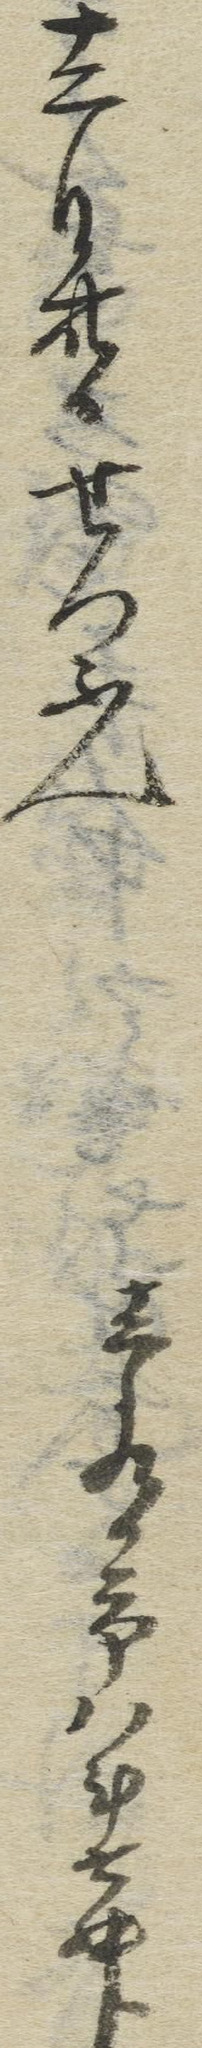十二月廿日せつふん十二月九日市八斗七升
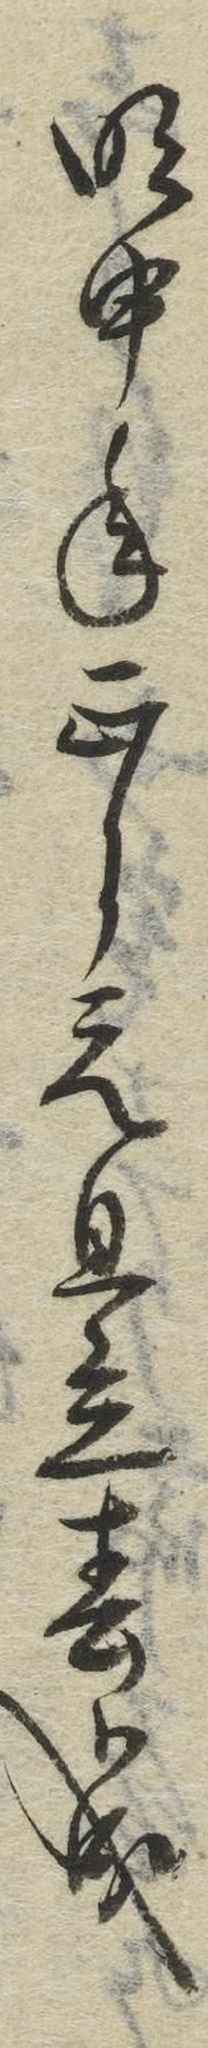明申年正月元旦立春二成
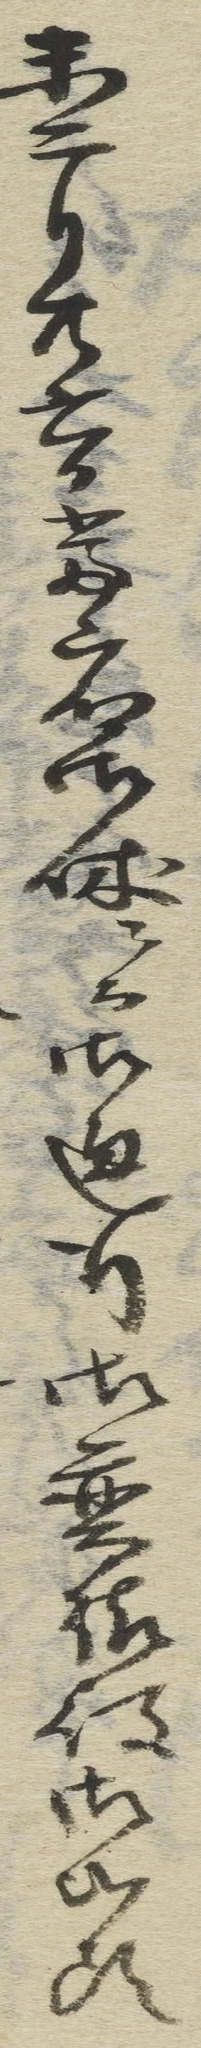未二月廿六日当宿御休二而御通行普請役御弐頭
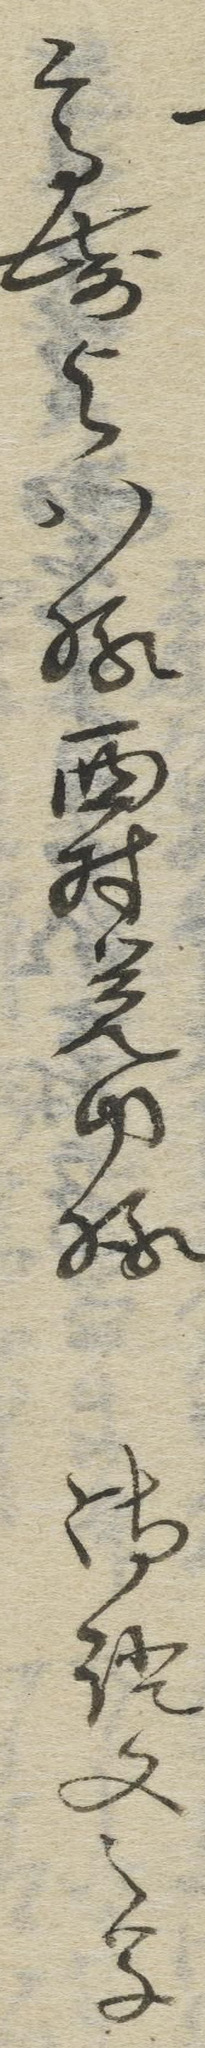高崎与八様西村覚内様御證文之写
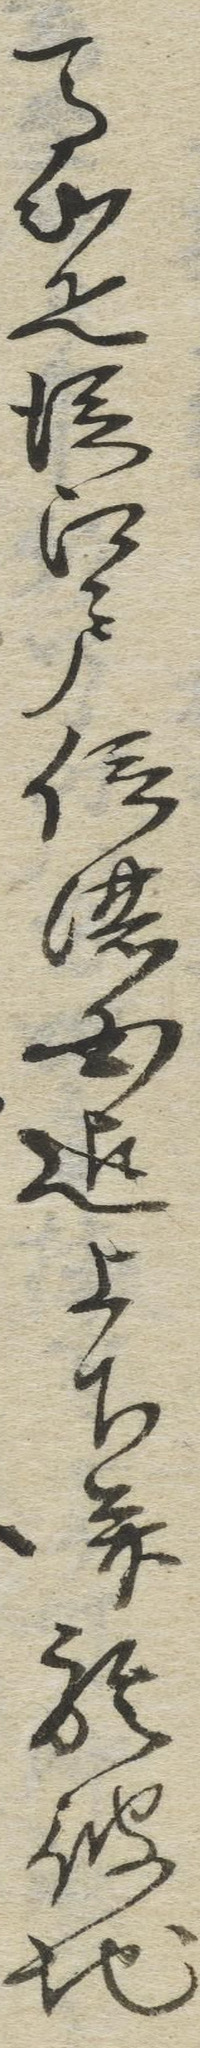馬弐疋従江戸信濃国迄上下并於彼地
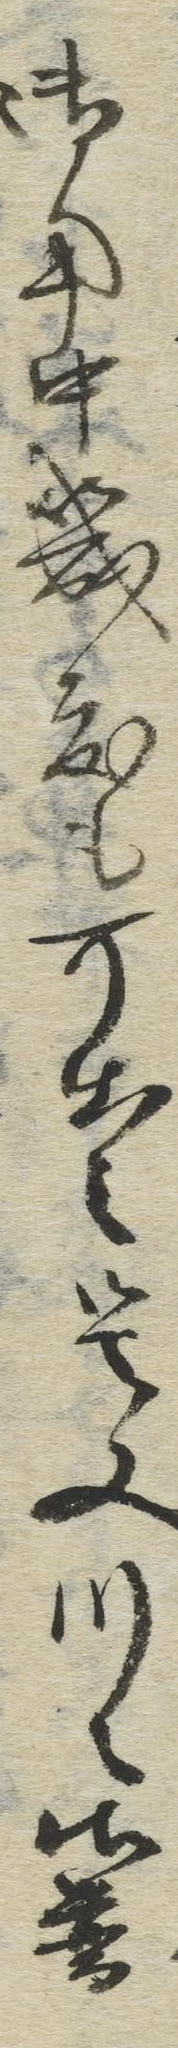御用中幾度も可出之且又川之御普
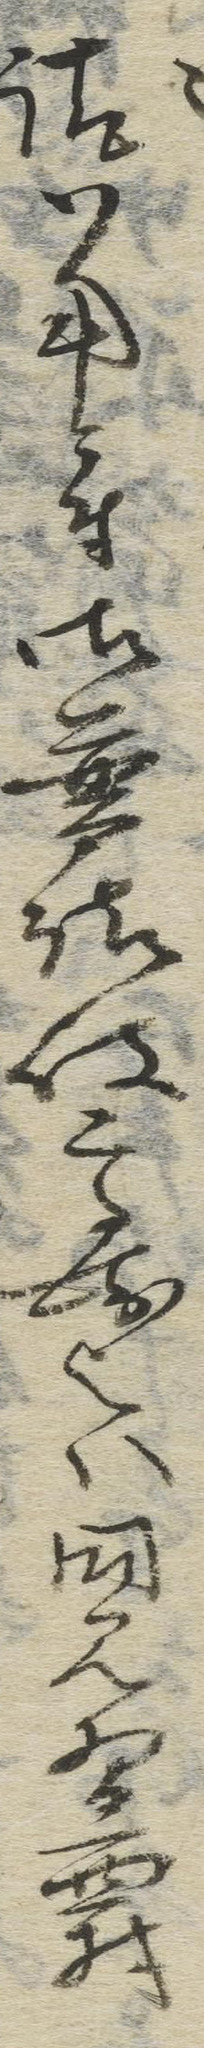請御用二付御普請役高崎与八同見習西村
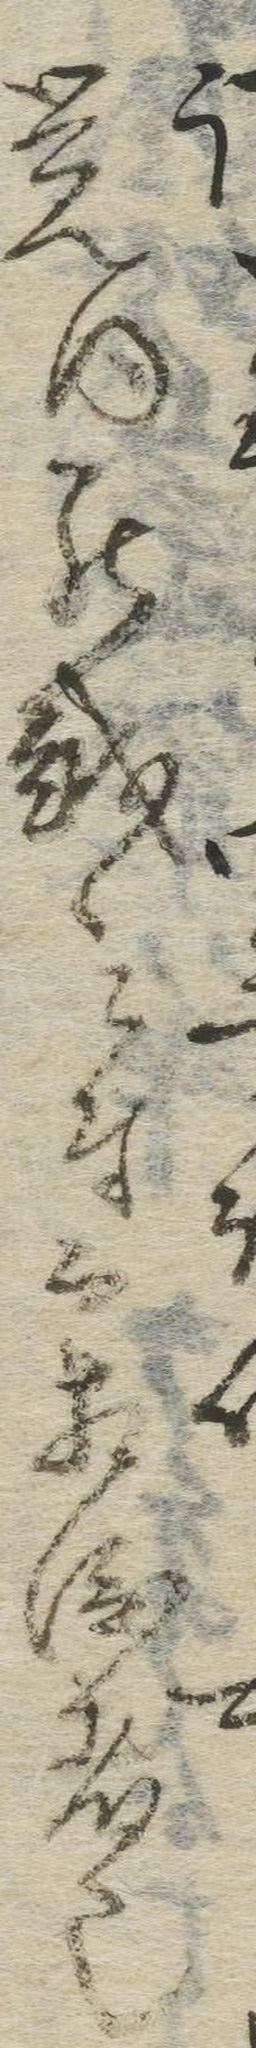覚内罷越候二付而相渡者候
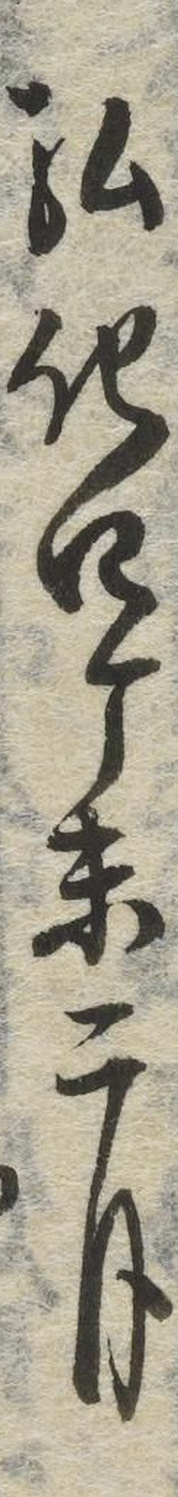弘化四丁未二月
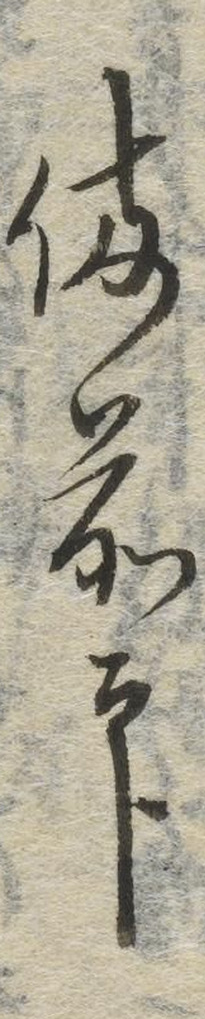備前印
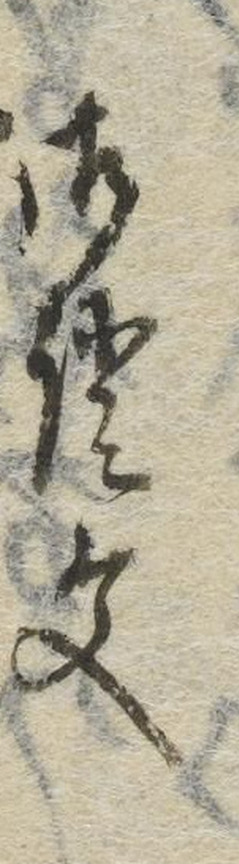御證文
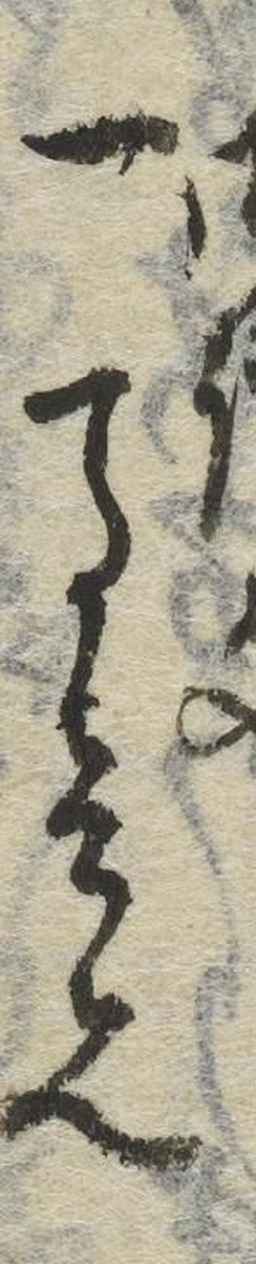一馬壱疋
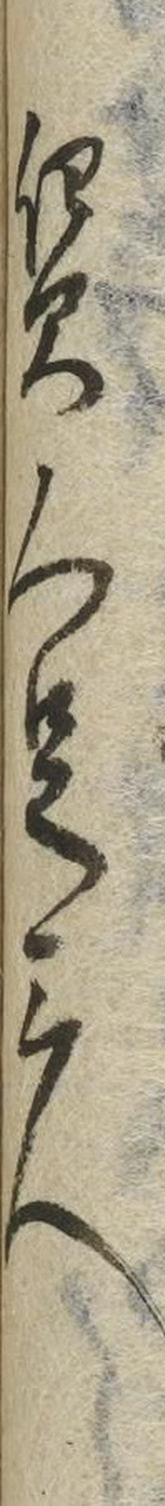賃人足三人
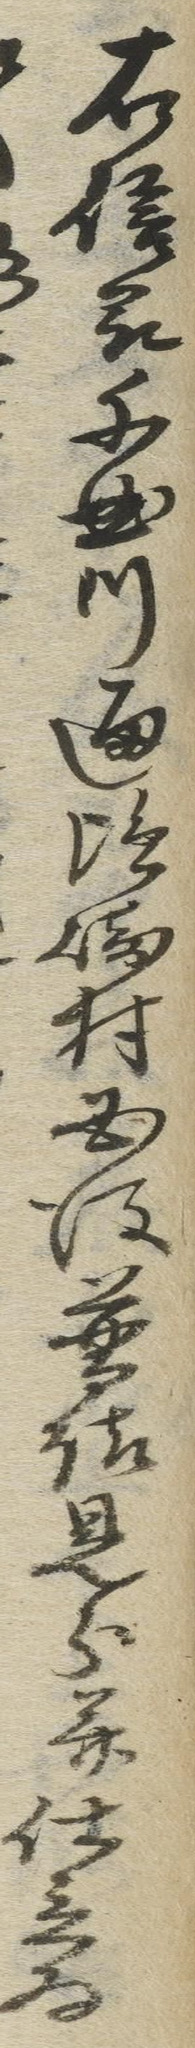右信州千曲川通塩崎村国役普請見分并仕立為
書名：信濃越後　地震書留
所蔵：東京大学地震研究所図書室 Earthquake Research Institute Library, The University of Tokyo, JAPAN
